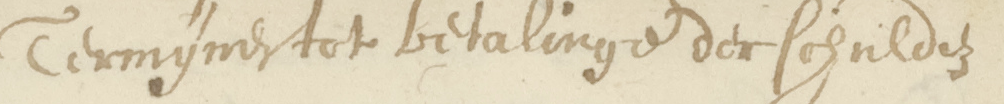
Termijnen tot betalinge der schulden
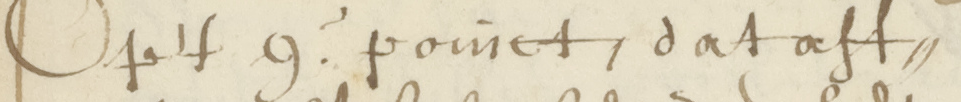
Op 't 9e. poinct, dat aff„
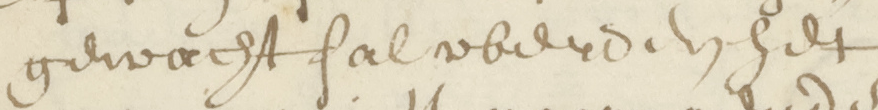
gewacht sal werden het
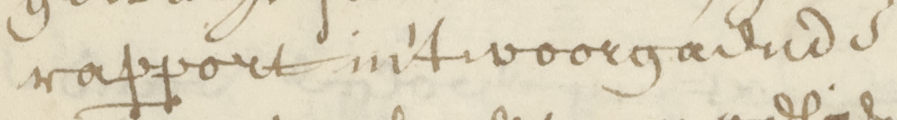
rapport in 't voorgaende
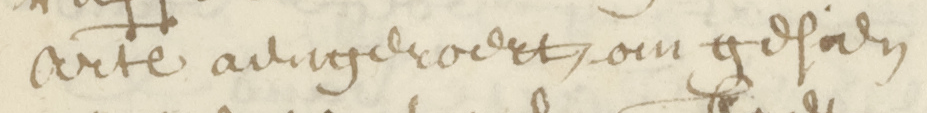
artl aengeroert, om gesien
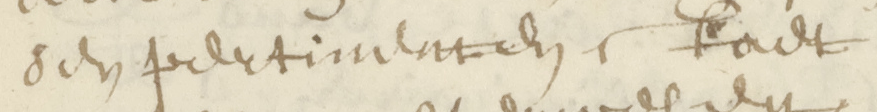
den pertinenten staet
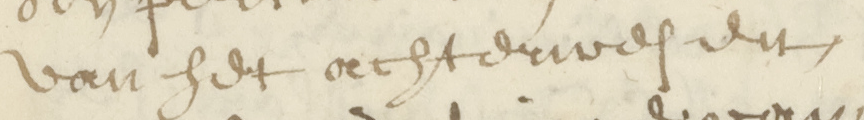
van het achterwesen,
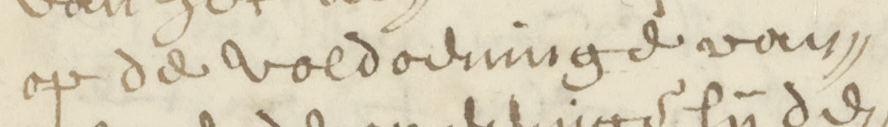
op de voldoeninge van„
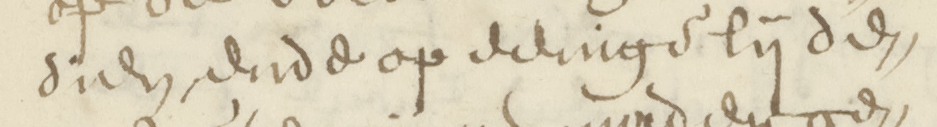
dien, ende op eenige lijde„
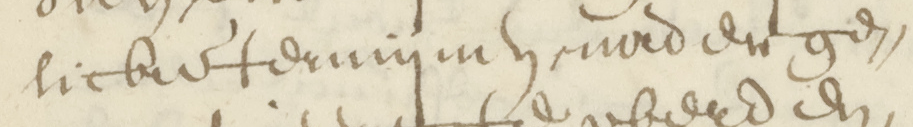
licke termijnen nader ge„
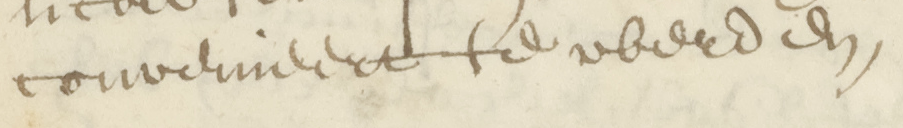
convenieert te werden.
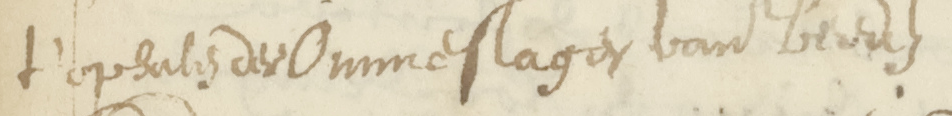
t'ophalen der Ommeslagen van beeden
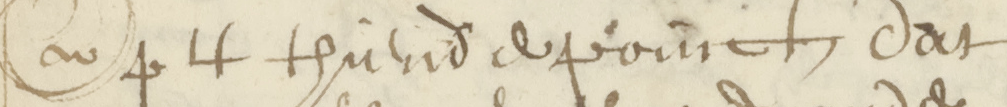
Opt thiende poinct, dat
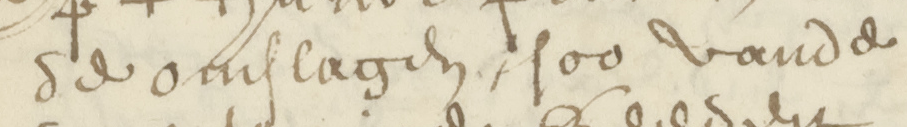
de omslagen, soo vande
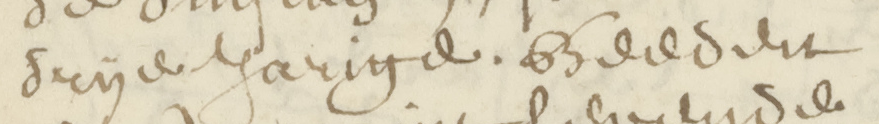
drije Jarige Beeden
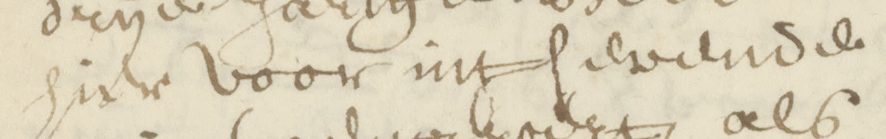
hier voor int sevende
